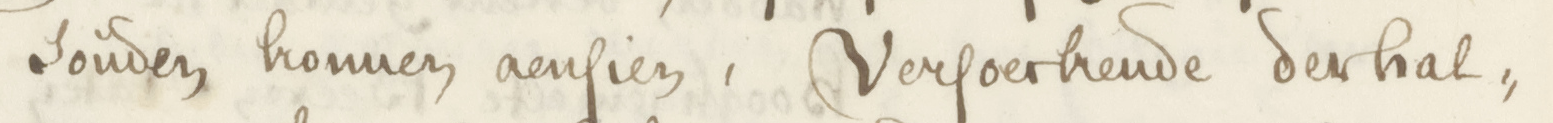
souden konnen aensien, Versoeckende derhal„
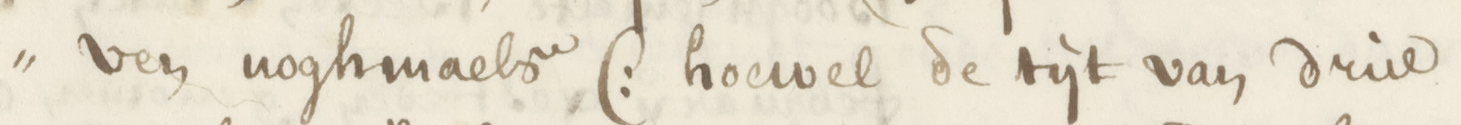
„ven noghmaels (hoewel de tijt van drie
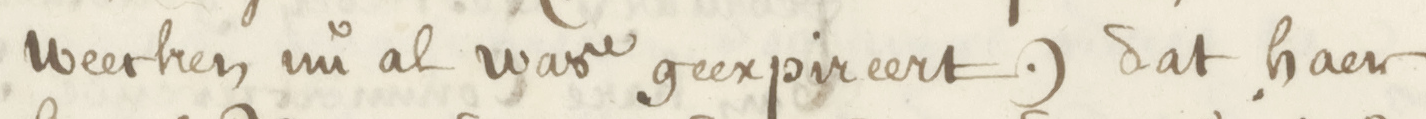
weecken nu al was geexpireert) dat haer
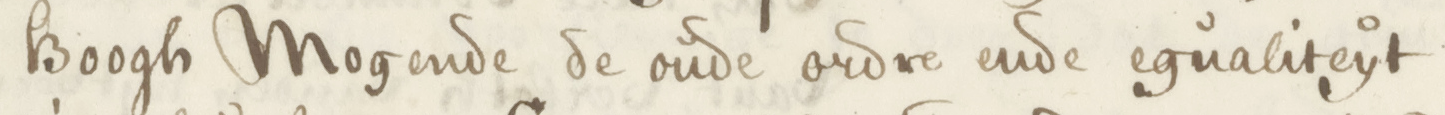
Hoogh Mogende de oude ordre ende egualiteijt
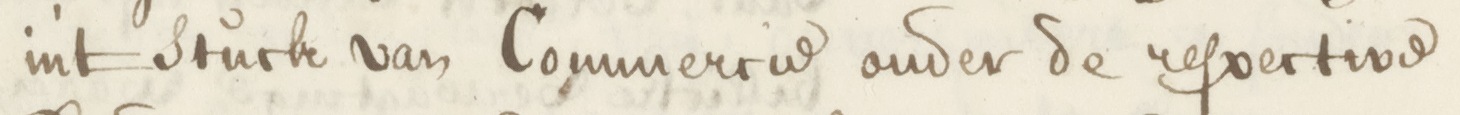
int Stuck van Commercie onder de respective
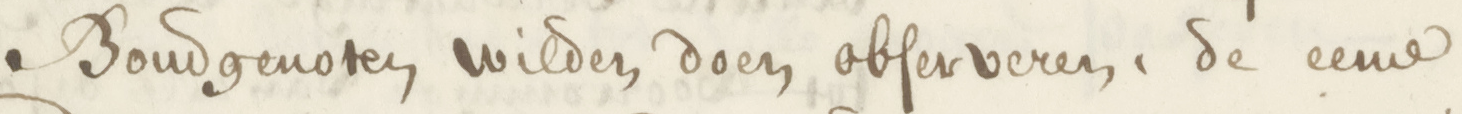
Bondgenoten wilden doen observeren, de eene
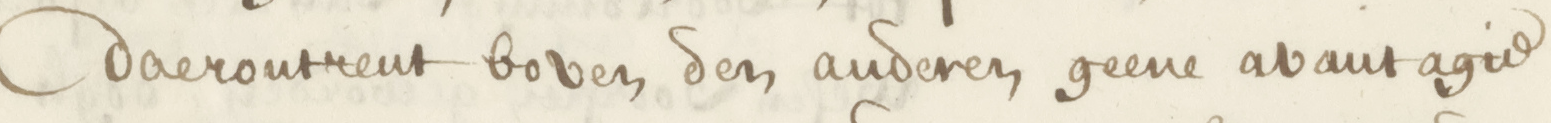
daerontrent boven den anderen geene avantagie
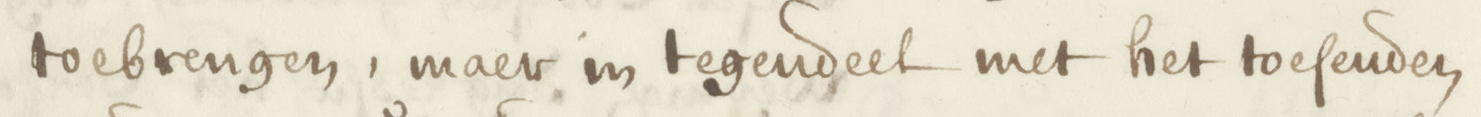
toebrengen, maer in tegendeel met het toesenden
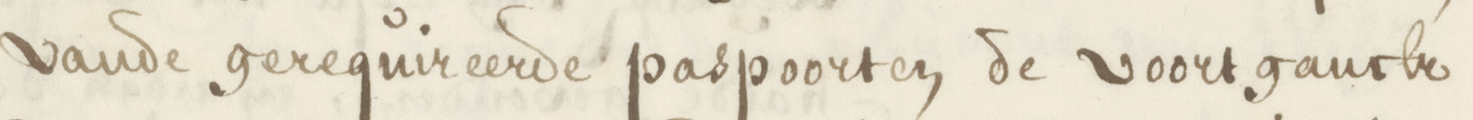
vande gerequireerde paspoorten de voortganck
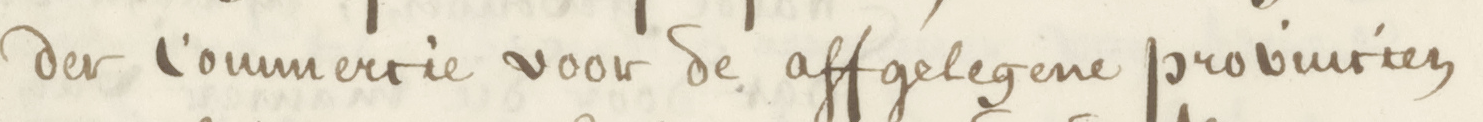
der Commercie voor de affgelegene provincien
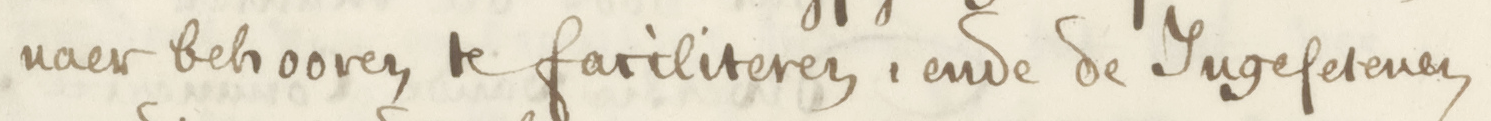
naer behooren te faciliteren, ende de Ingesetenen
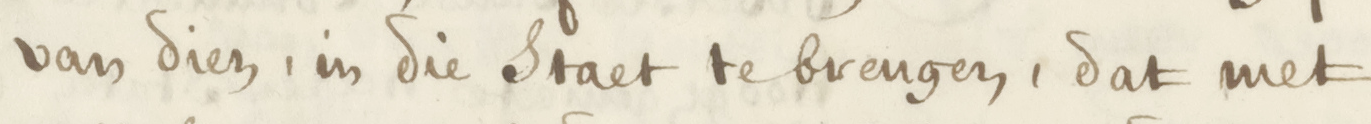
van dien, in die Staet te brengen, dat met
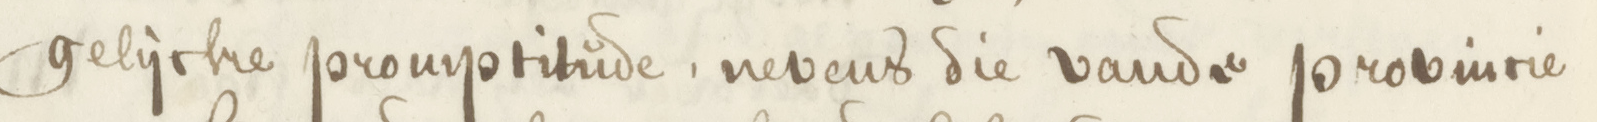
gelijcke promptitude, nevens die vande provincie
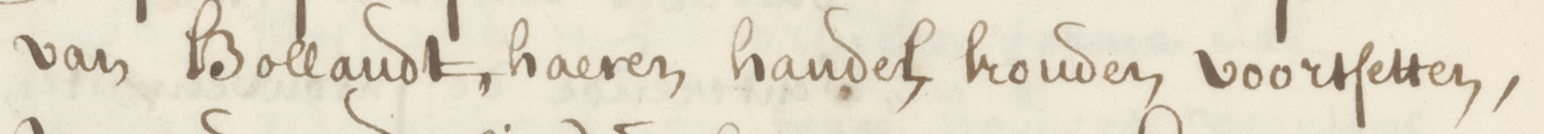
van Hollandt, haeren handel konden voortsetten,
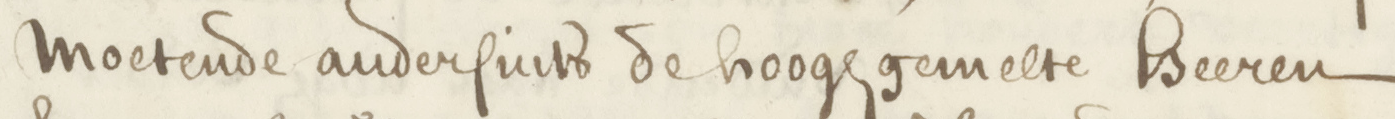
moetende andersints de hooghgemelte Heeren
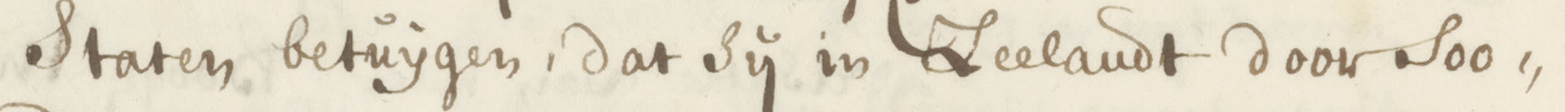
Staten betuijgen, dat sij in Zeelandt door soo„
